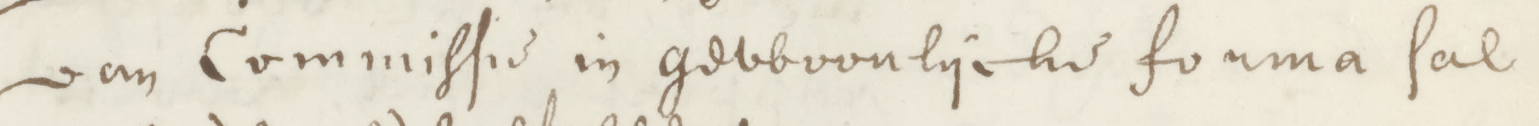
van Commissie in gewoonlijcke forma sal
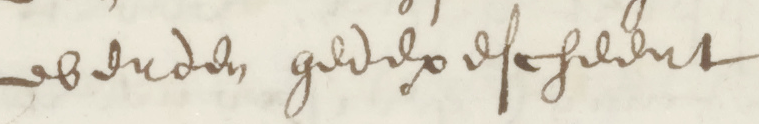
werden gedepescheert.
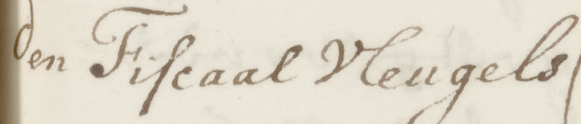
den Fiscaal Vleugels
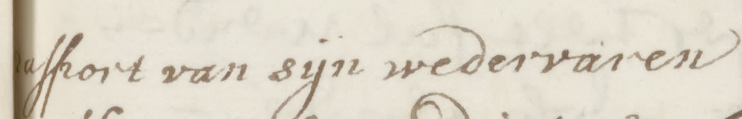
(r)apport van sijn wedervaren
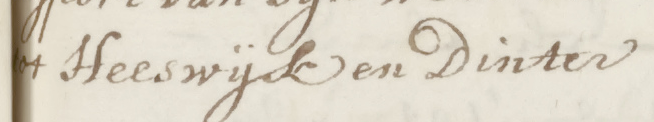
(t)ot Heeswijck en Dinter
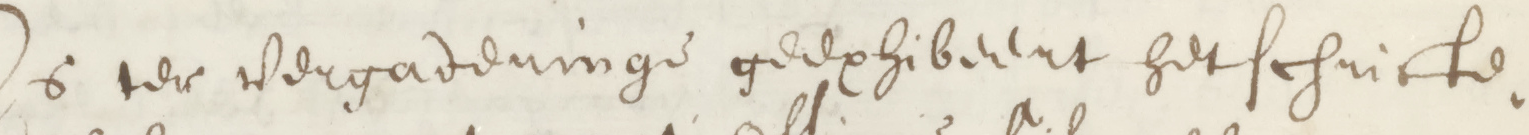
Is ter Vergaderinge geexhibeert het schrifte„
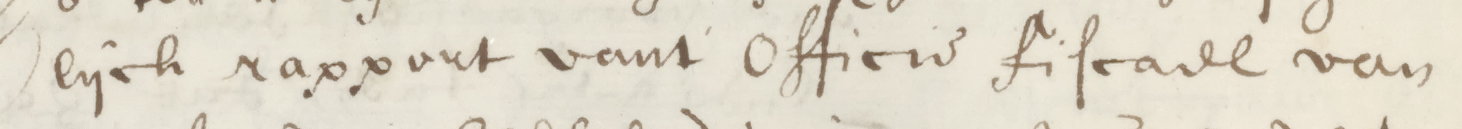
lijck rapport vant' Officie Fiscael van
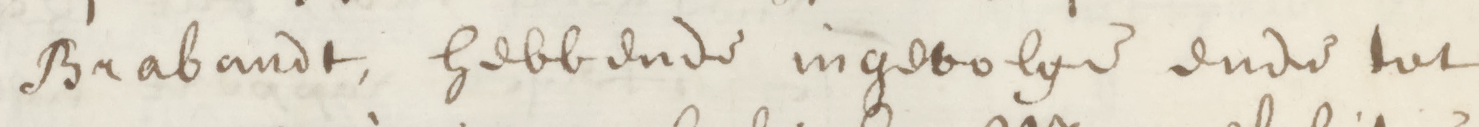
Brabandt, hebbende ingevolge ende tot
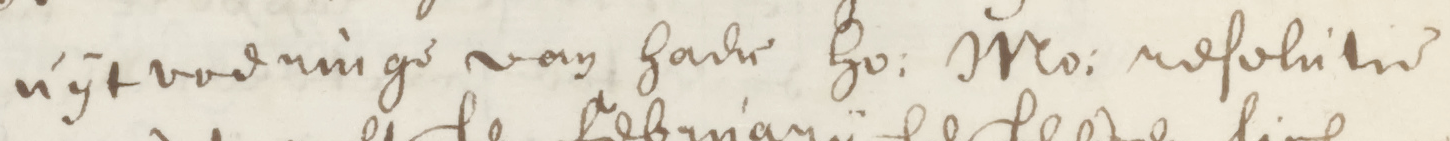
uijtvoeringe van haer ho:Mo: resolutie
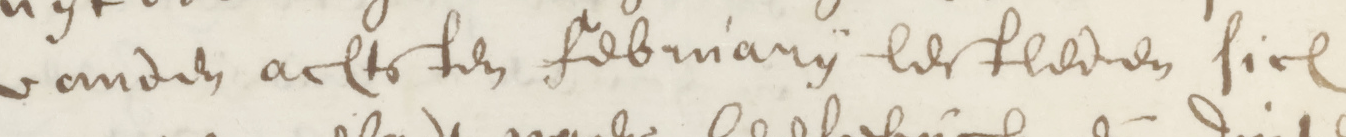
vanden achtsten februarij lestleden sich
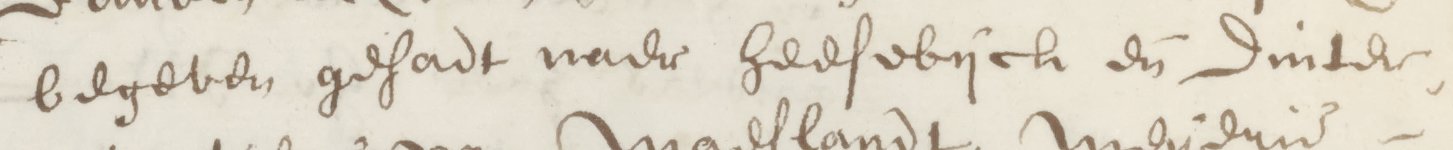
begeven gehadt naer heesewijck en Dinter,
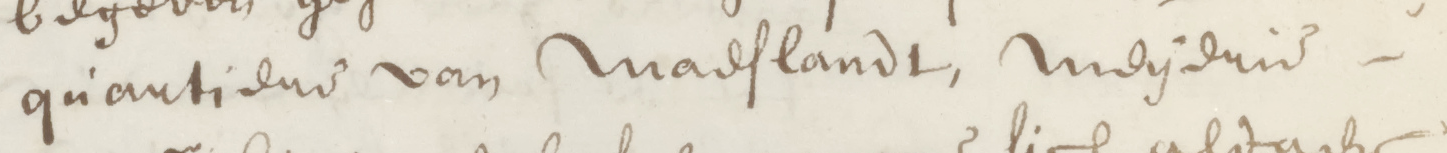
quartiere van Maeslandt, Meijerie —
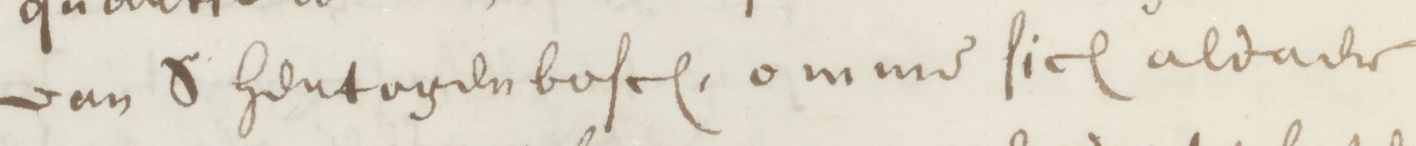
van Shertogenbosch, omme sich aldaer
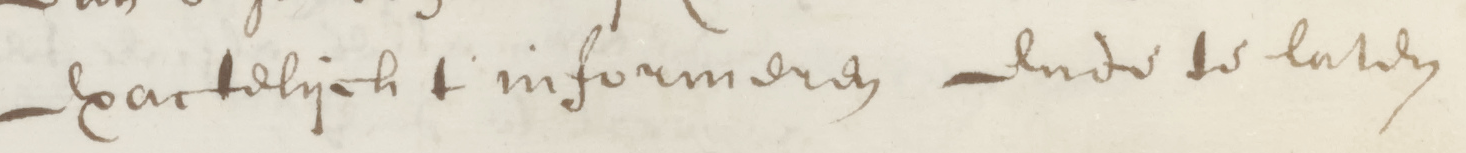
exactelijck t‛ informeren Ende te laten
